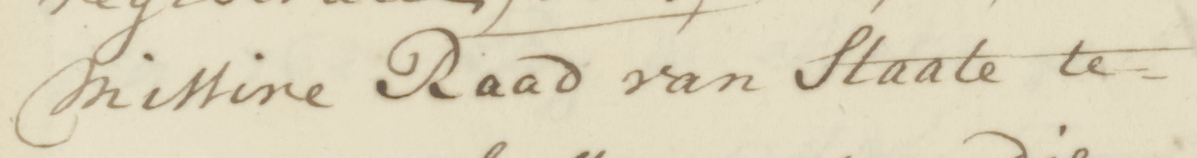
Missive Raad van Staate te„
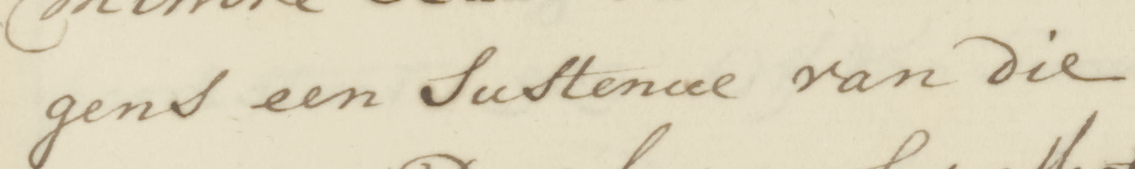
gens een sustencie van die
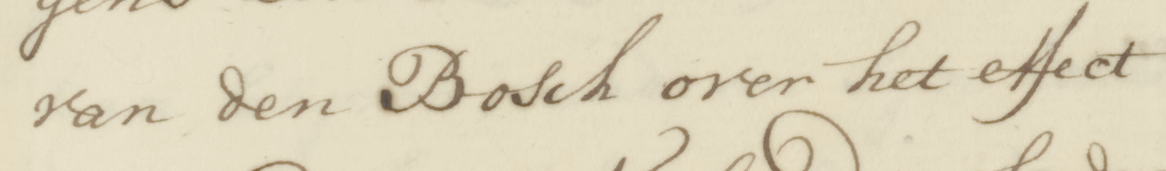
van den Bosch over het effect
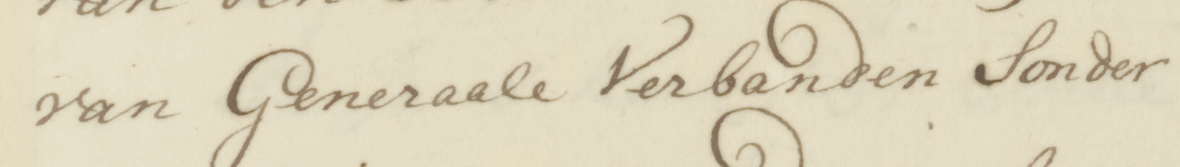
van Generaale Verbanden sonder
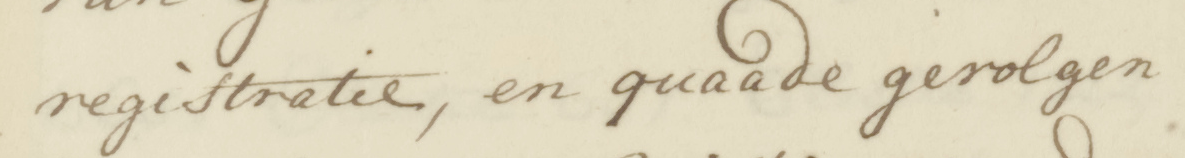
registratie, en quaade gevolgen
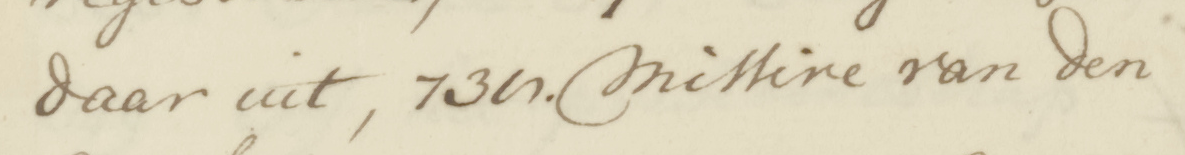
daar uit, 738. Missive van den
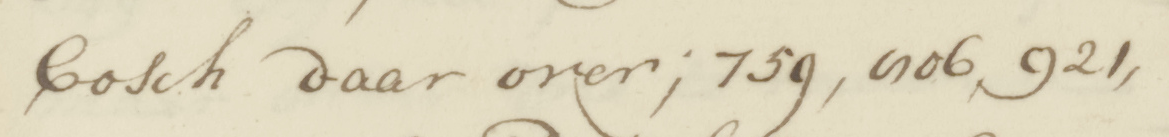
bosch daar over; 759, 806, 921,
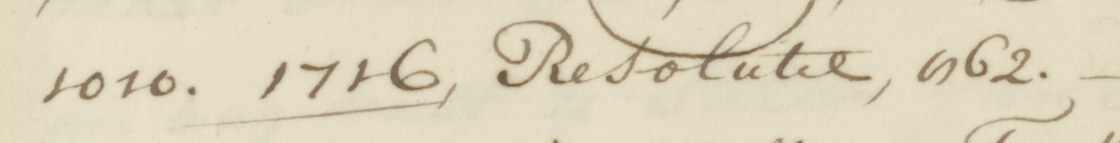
1010. 1716, Resolutie, 862.
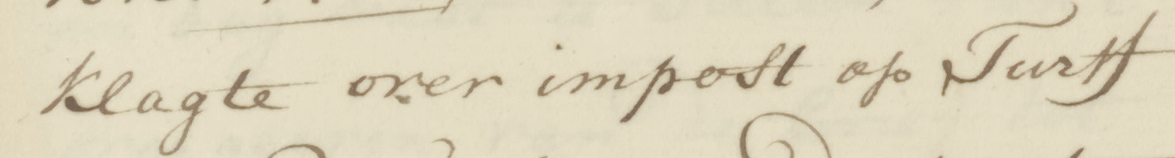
Klagte over impost op Turff
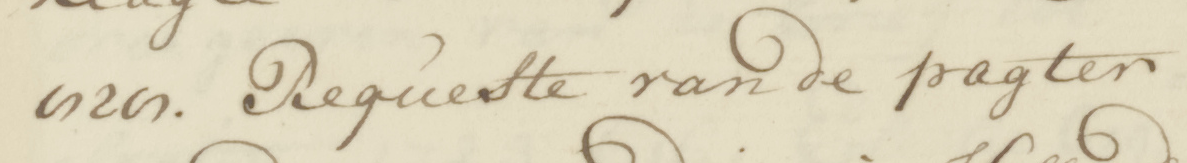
828. Requeste van de pagter
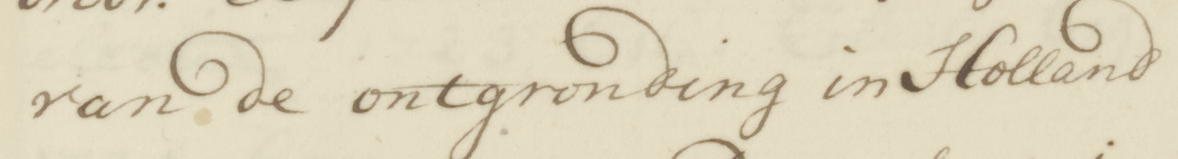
van de ontgronding in Holland
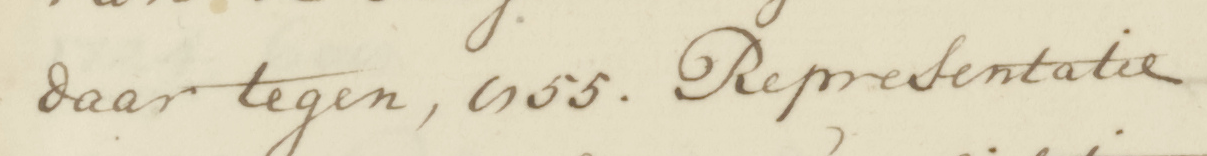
daar tegen, 855. Representatie
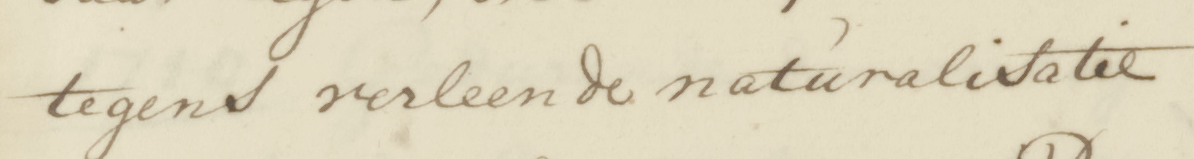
tegens verleende naturalisatie
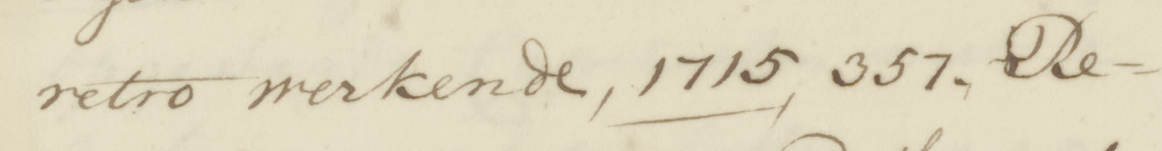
retro werkende, 1715, 357. Re„
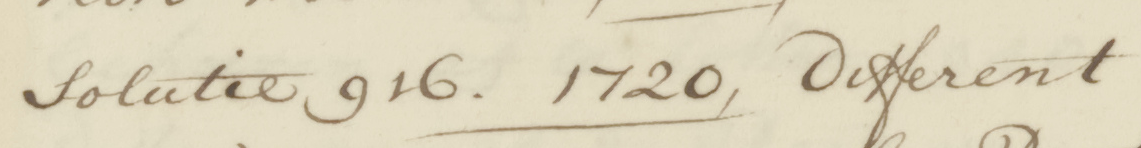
solutie 916. 1720, different
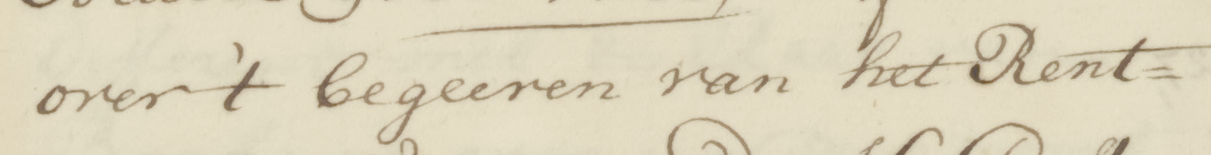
over 't begeeven van het Rent=
